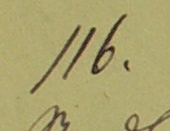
116
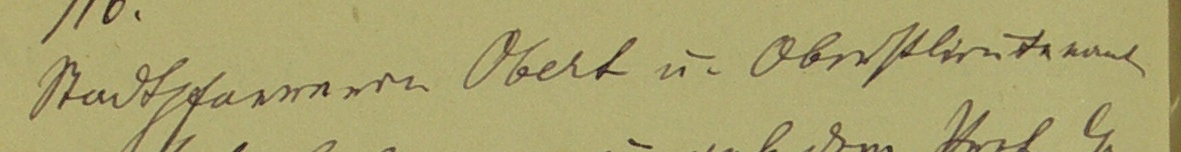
Stadtpfarrer Obert und Oberstlieutenent
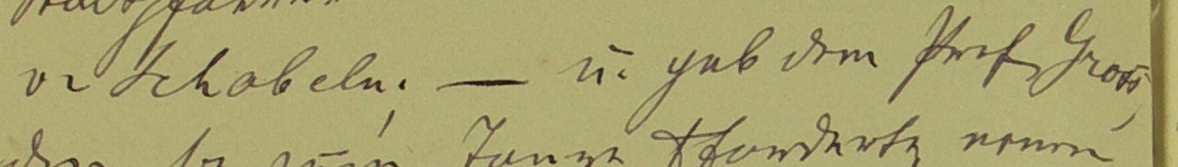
v. Schobeln; - und gab dem Prof. Gross,
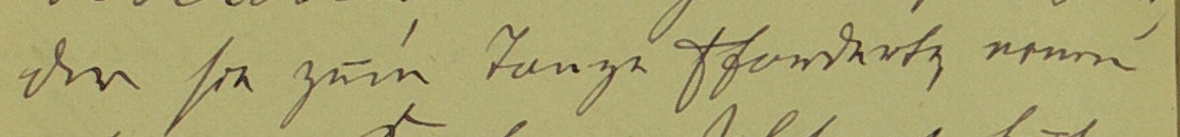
der sie zum Tanz fforderte einen
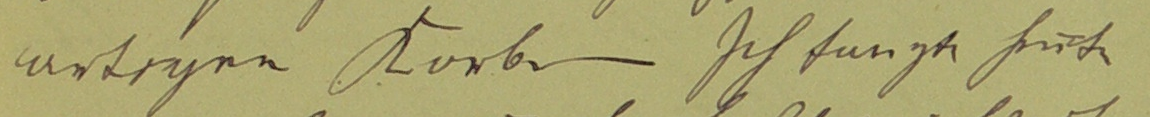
artigen Korb; - Ich tanzte heute
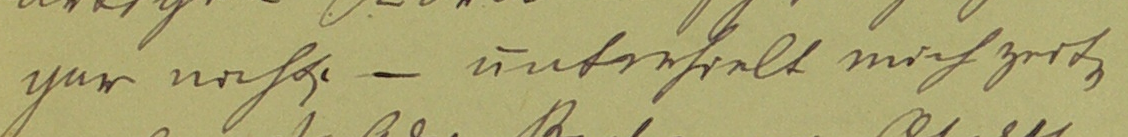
gar nicht, - unterhielt mich zeit¬
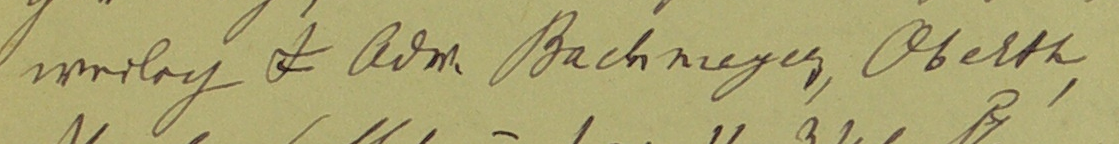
weilig t Adv. Bachmeyer , Oberth,
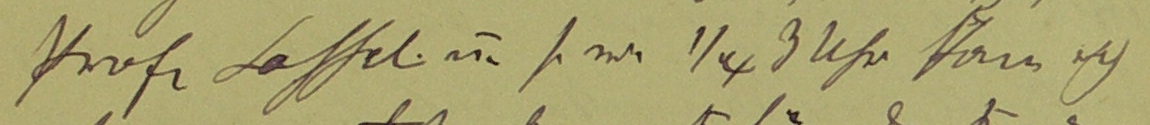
Prof. Lassel u.s.w. ¼ 3 Uhr kam
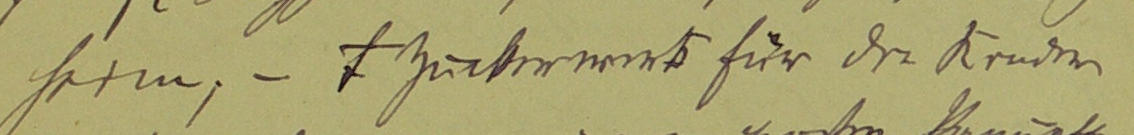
ich heim, - Mit Zuckerwerk für die Kinder
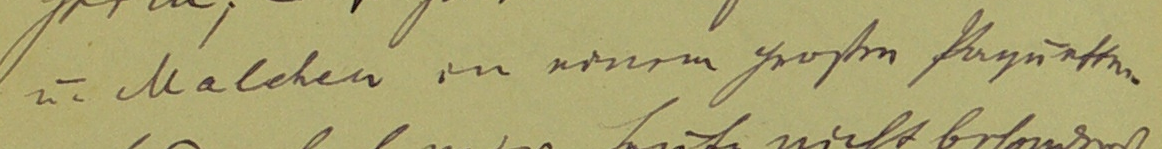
u. Malchen in einem großen Paquette.
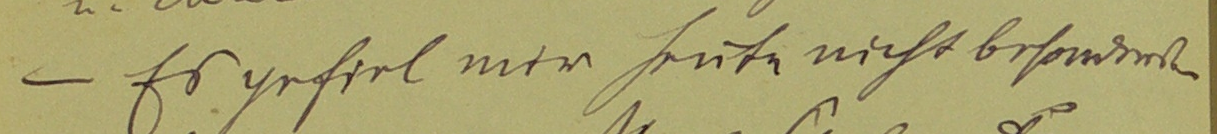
- Es gefiel mir heute nicht besonders.
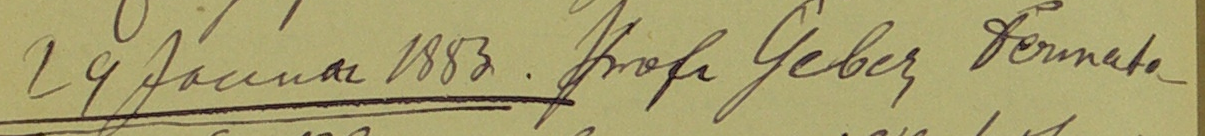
29. Januar 1883. Prof. Geber, Dermato¬
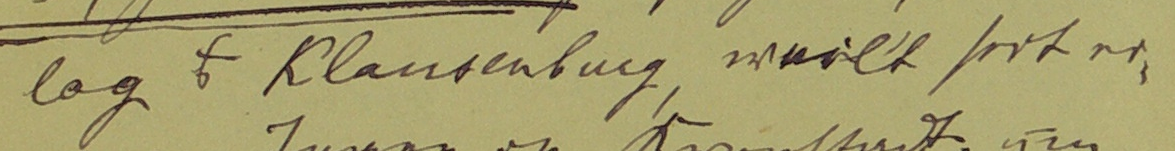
loge aus Klausenburg, weilt seit ei¬
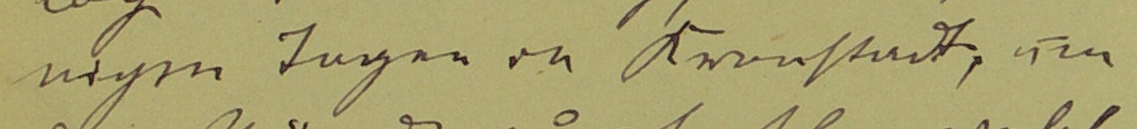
nigen Tagen in Kronstadt, um
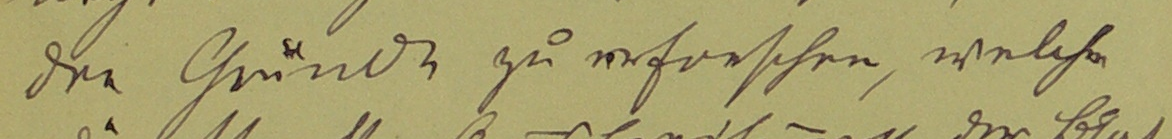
die Gründe zu erfahren, welche
